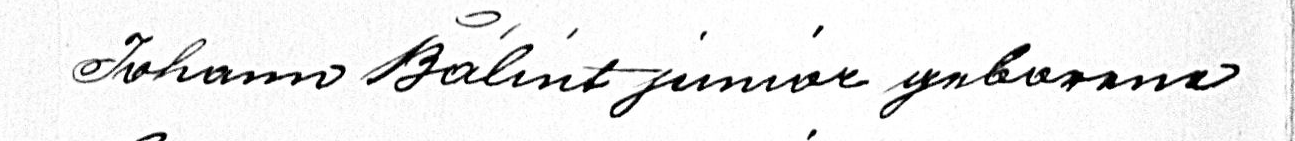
Johann Bálint junior geborene
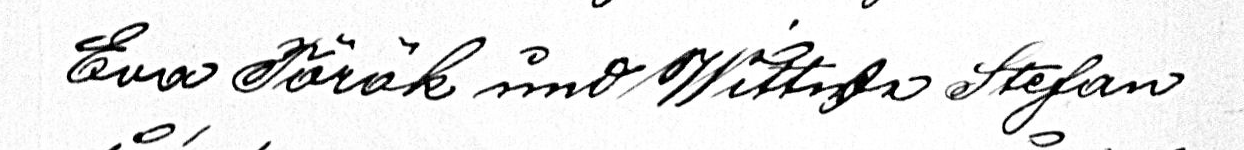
Eva Török und Wittw Stefan
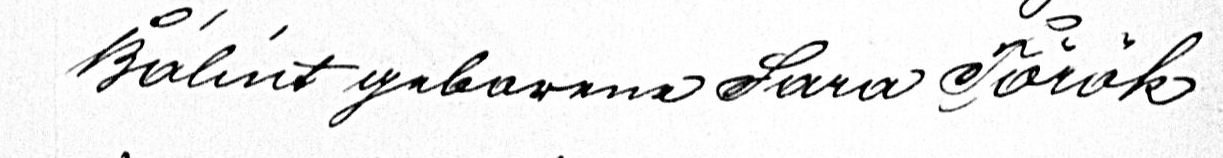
Bálint geborene Sara Török
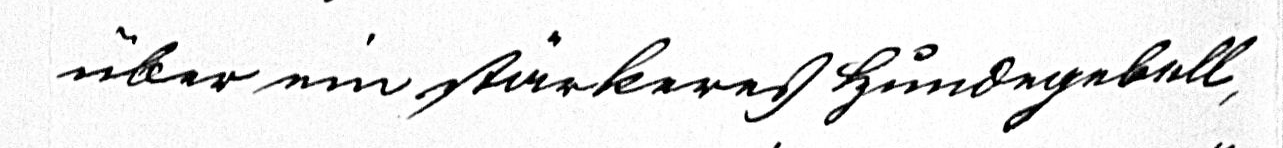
über ein stärkeres Hundegebell,
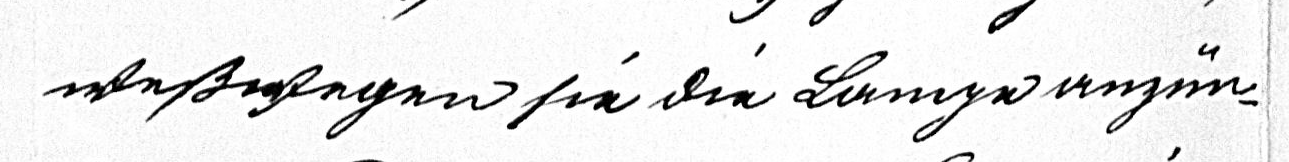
weßwegen sie Lampe anzün¬
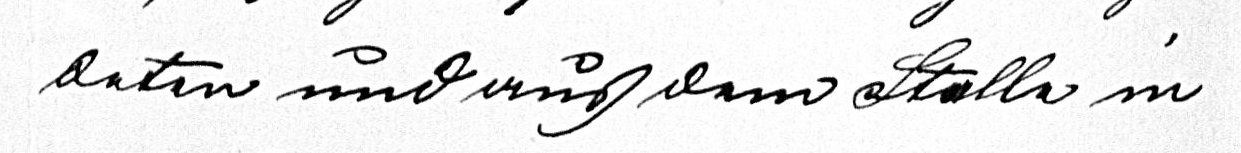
deten und aus dem Stalle in
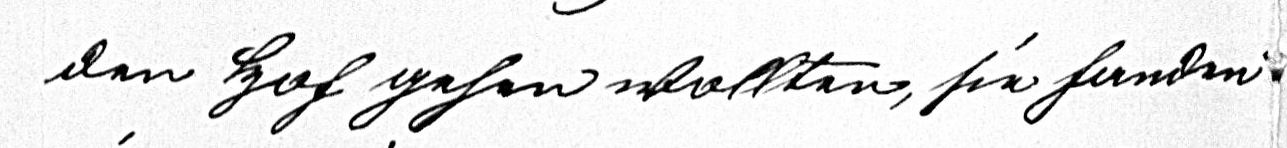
den Hof gehen wollten, sie fanden
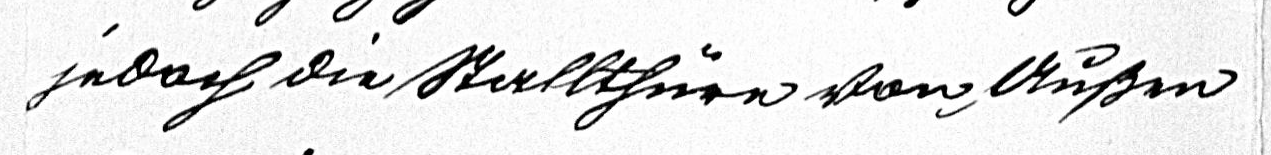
jedoch die Stallthürevon Außen
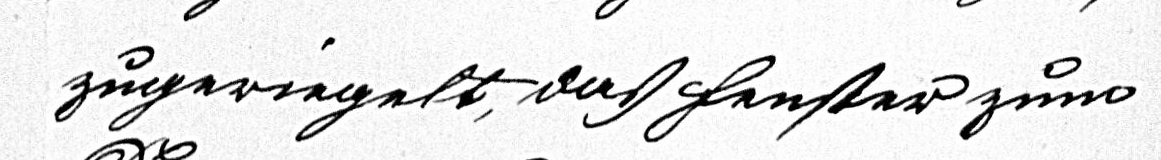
zugeriegelt, dasfFenster zum
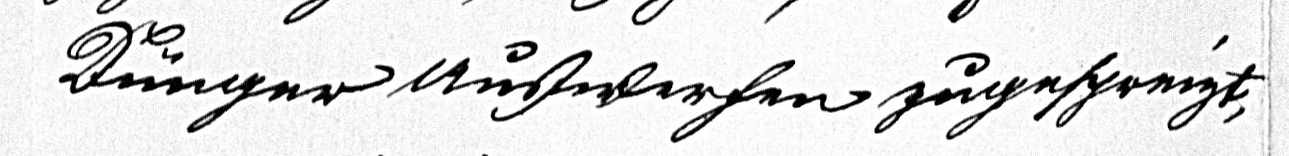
Dünger Auswerfen zugespreizt,
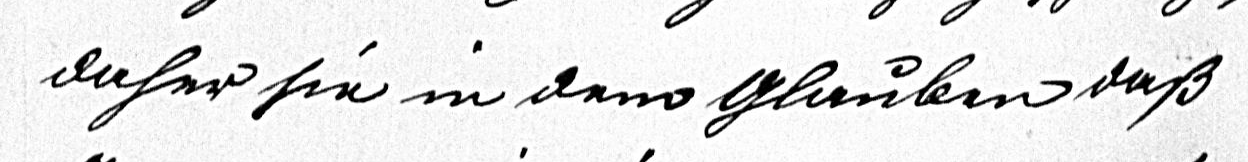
daher sie in dem Glauben daß
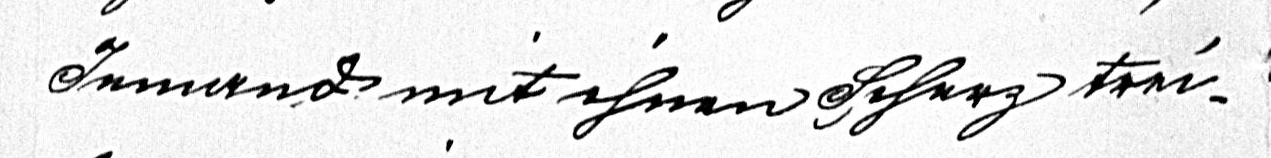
Inmand mit ihnen Scherz trei¬
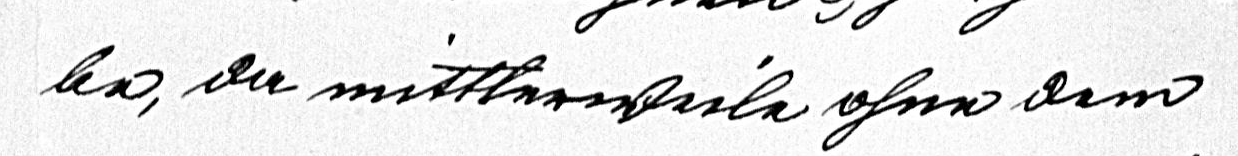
be, da mittlerweile ohne dem
